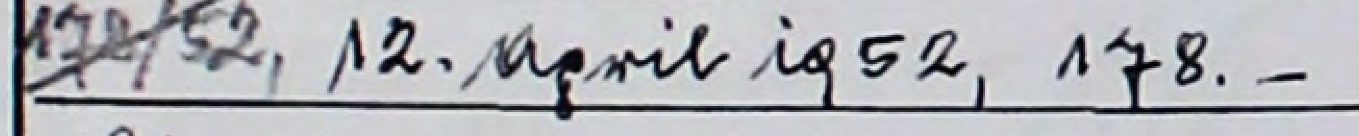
178/52, 12. April 1952, 178. -
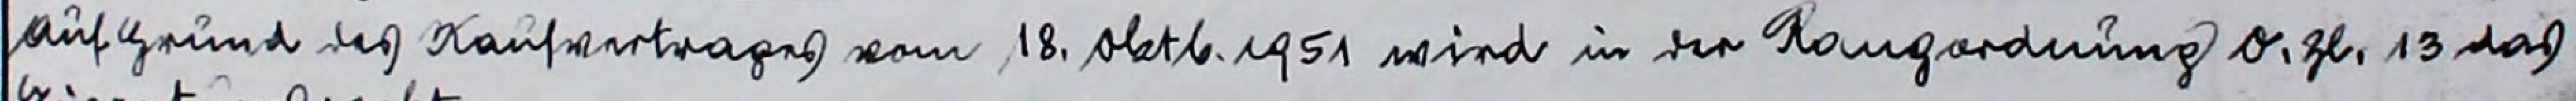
Auf Grund des Kaufvertrages vom 18. Oktb. 1951 wird in der Rangordnung v. Zl. 13 das
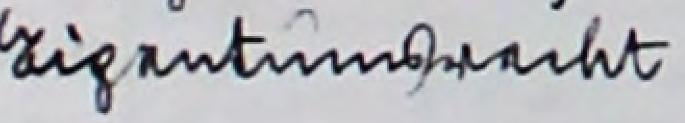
Eigentumsrecht
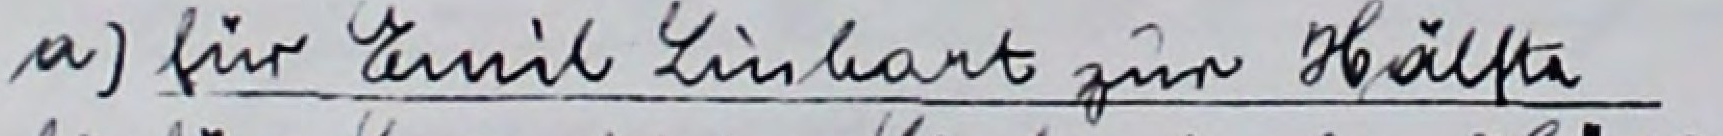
a) für Emil Linhart zur Hälfte
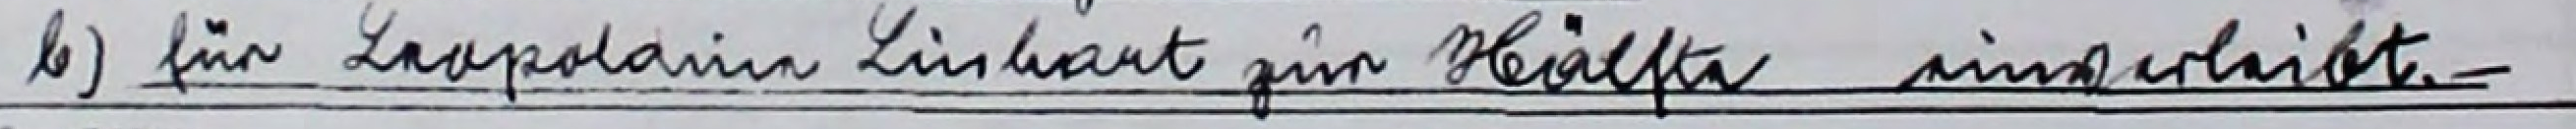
b) für Leopoldine Linhart zur Hälfte einverleibt. -
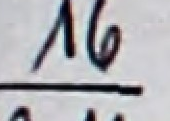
16
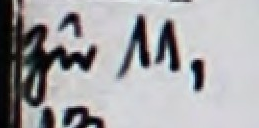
zu 11,
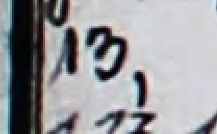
13,
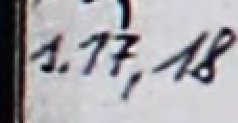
s. 17, 18
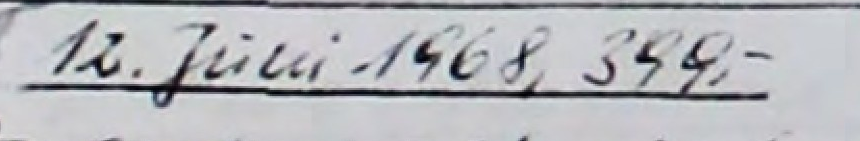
399/68 12. Juli 1968, 399.-
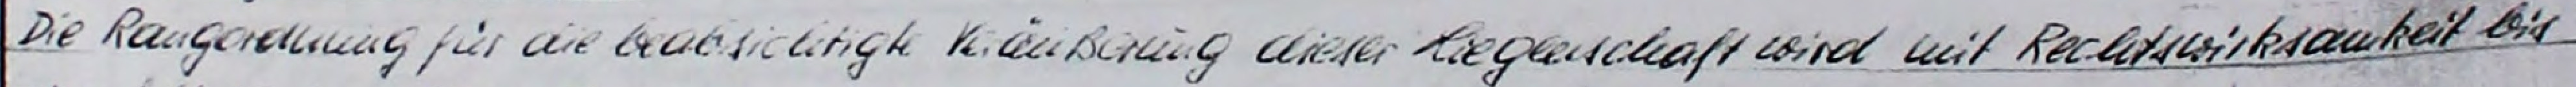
Die Rangordnung für die beabsichtigte Veräußerung dieser Riegenschaft wird mit Rechtswirksamkeit bis
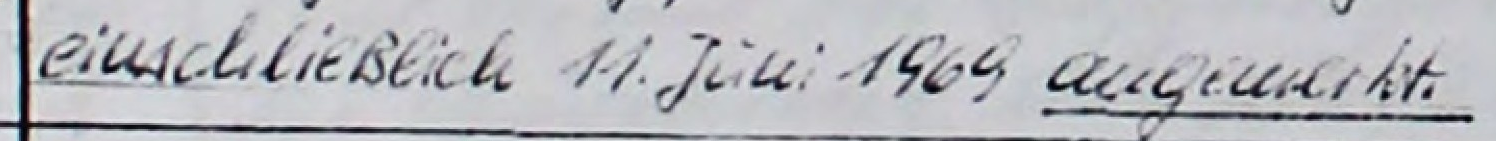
einschließlich 11. Juni 1969 angemerkt.
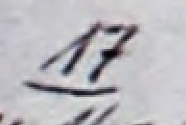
17
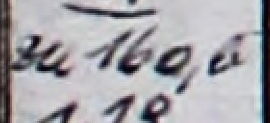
zu 160, 6
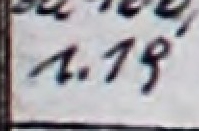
s. 19
